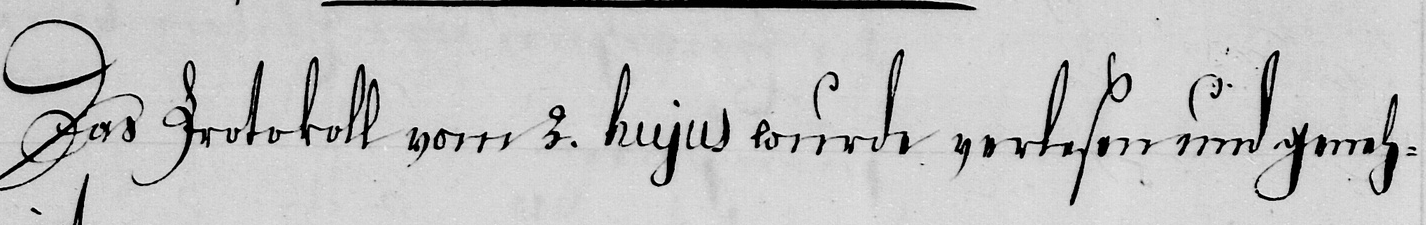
Das Protokoll vom 2. hujus wurde verlesen und geneh¬
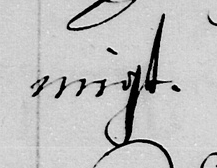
migt.
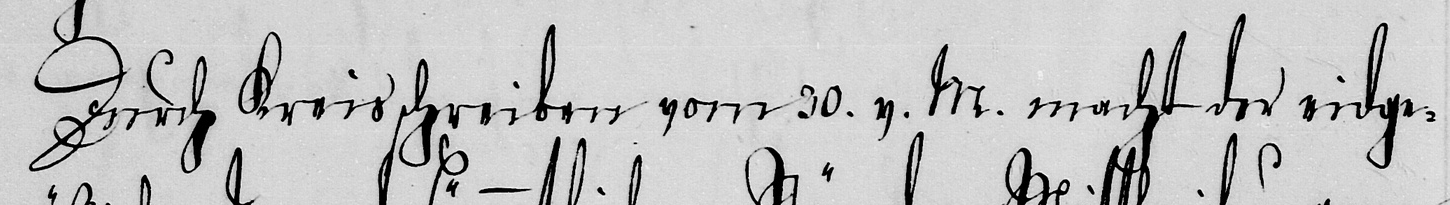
Durch Kreisschreiben vom 30. v. M. macht der eidge¬
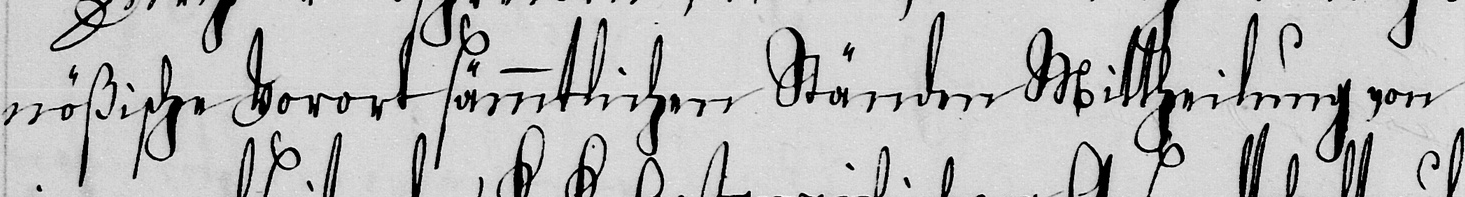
nößische Vorort sämmtlichen Ständen Mittheilung von
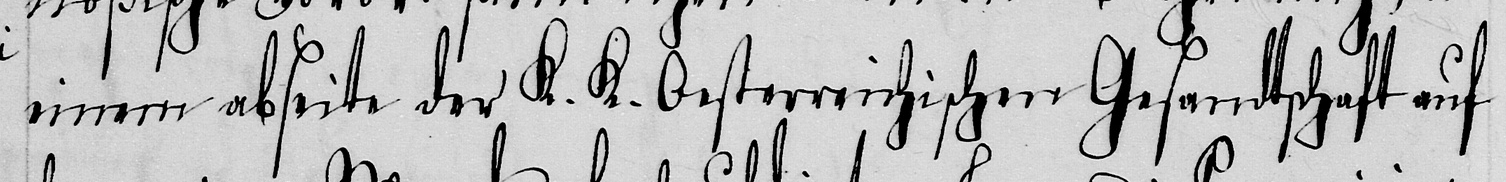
einem abseite der K. K. Oesterreichischen Gesandtschaft auf
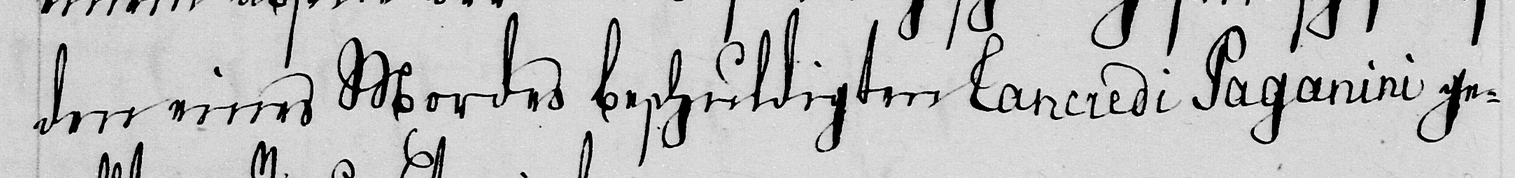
den eines Mordes beschuldigten Tancredi Paganini ge¬
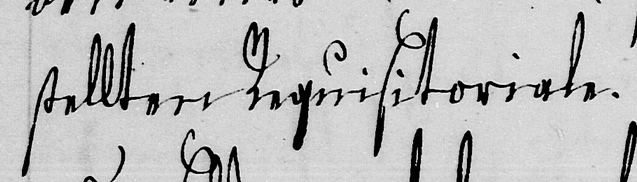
stellten Requisitoriale.
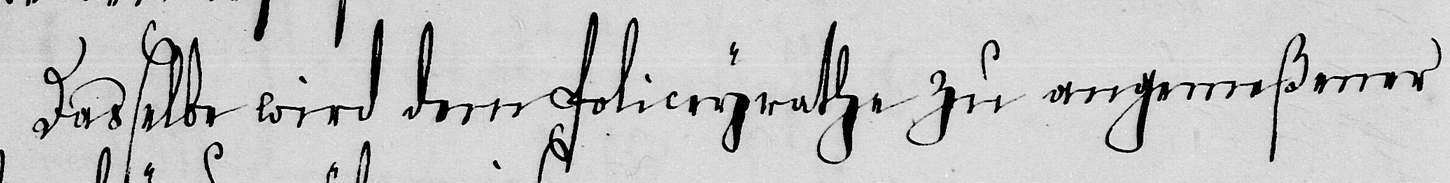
Dasselbe wird dem Policeyrathe zu angemeßener
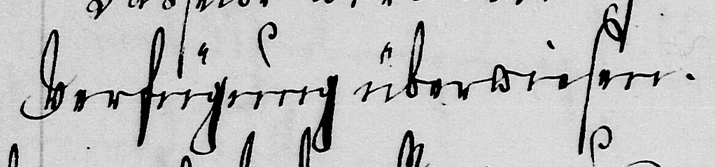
Verfügung überwiesen.
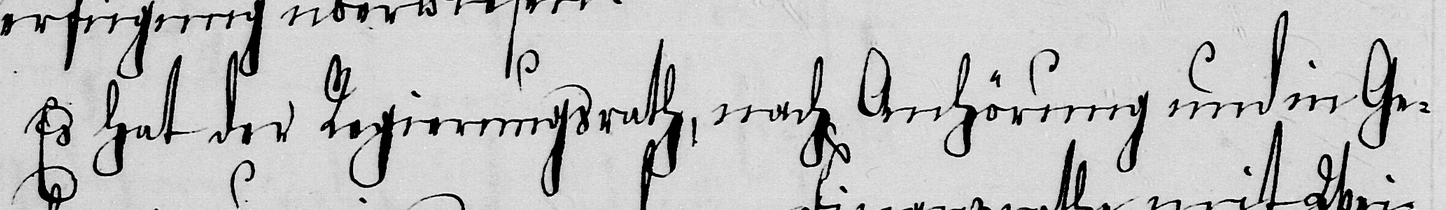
Es hat der Regierungsrath, nach Anhörung und in Ge¬
